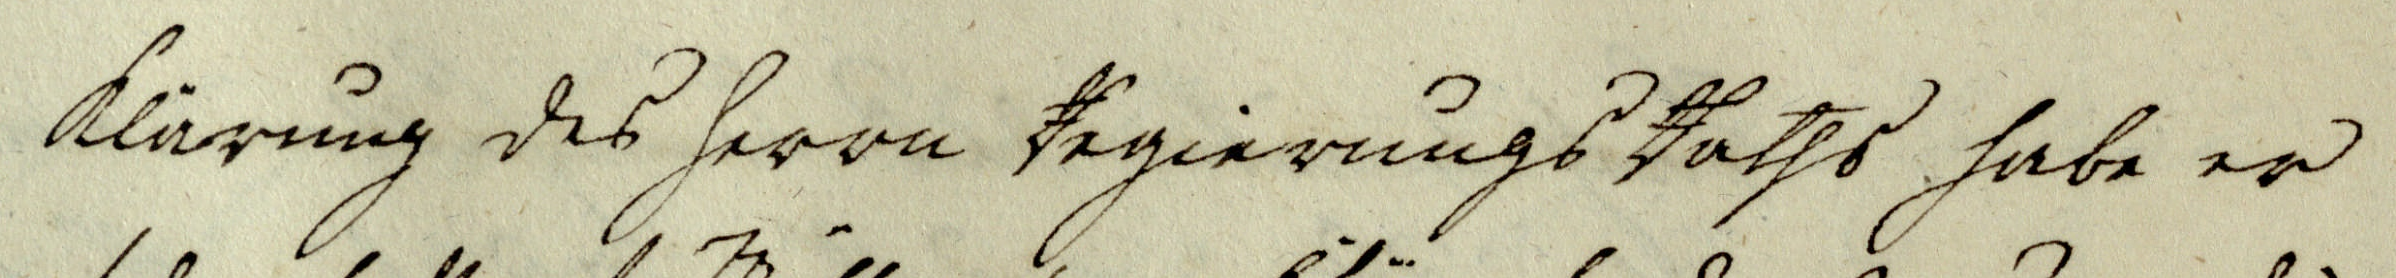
klärung des Herrn Regierungs Raths habe er
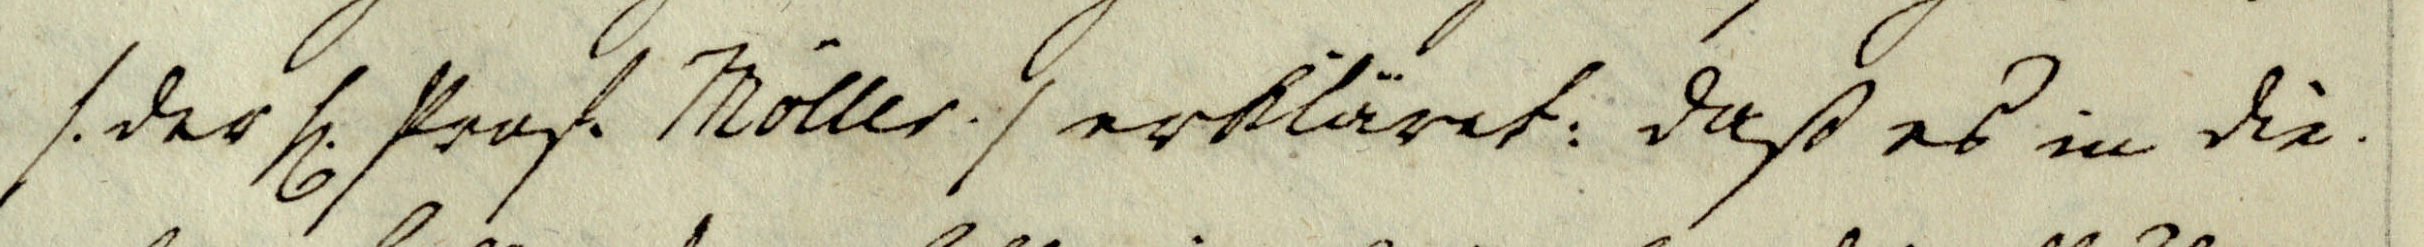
/. der h. Prof. Möller ./ erkläret: daß es in die¬
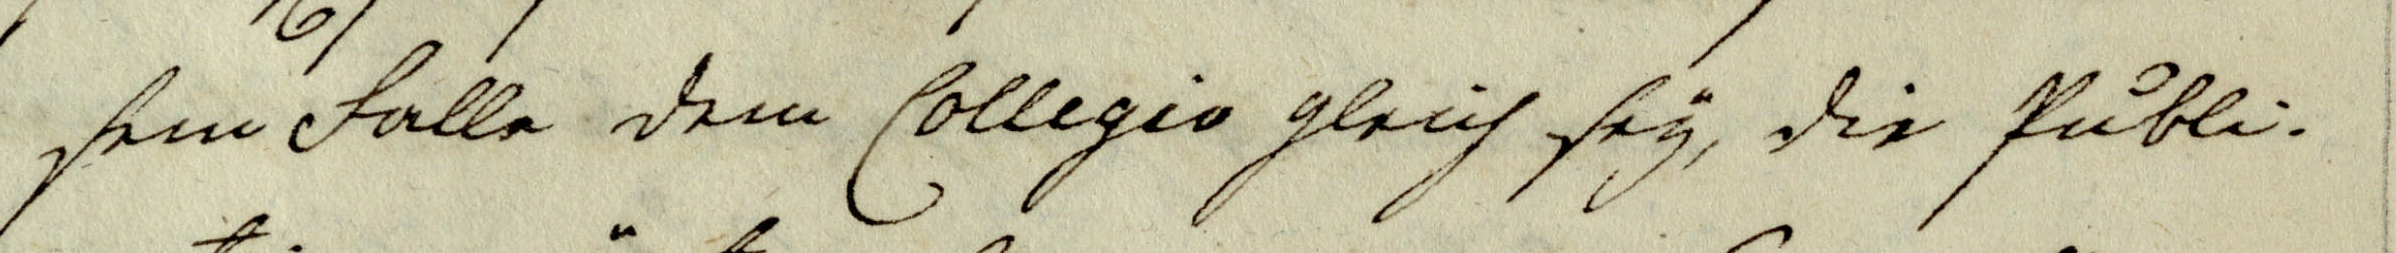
sem Falle dem Collegio gleich seÿ, die Publi¬
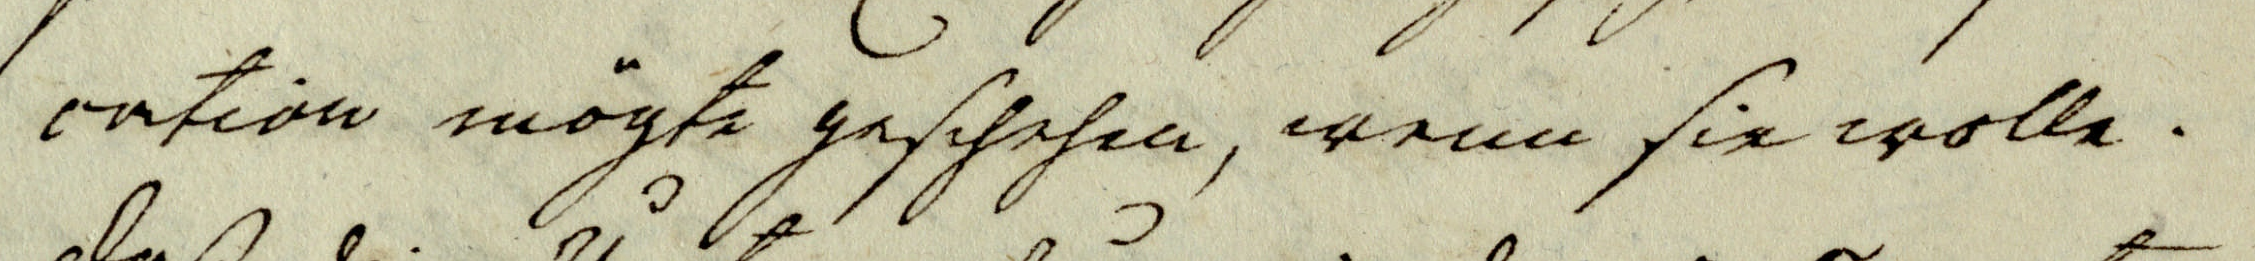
cation mögte geschehen, wenn sie wolle.
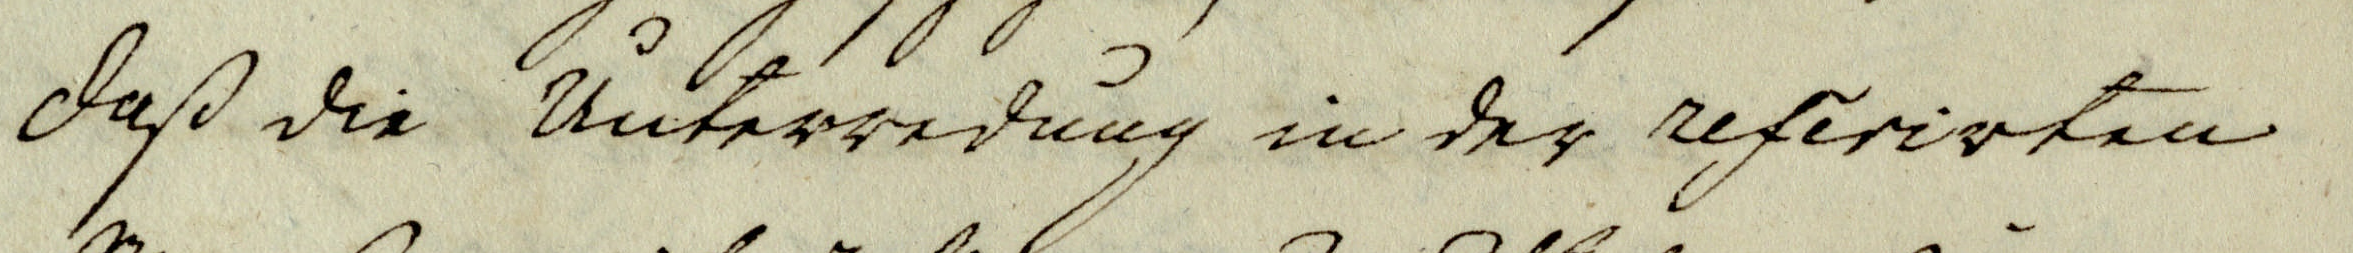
Daß die Unterredung in der referirten
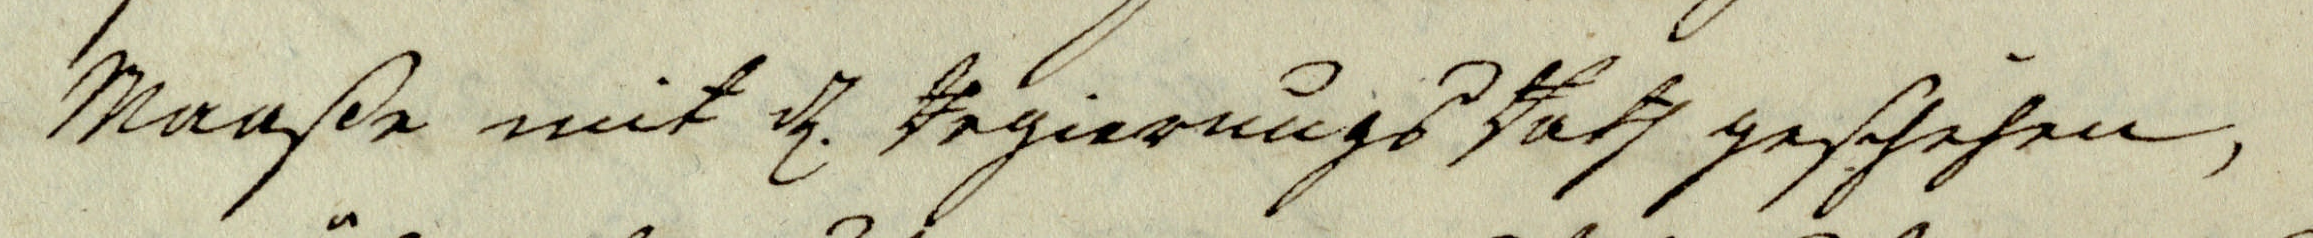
Maaße mit dh. Regierungs Rath geschehen,
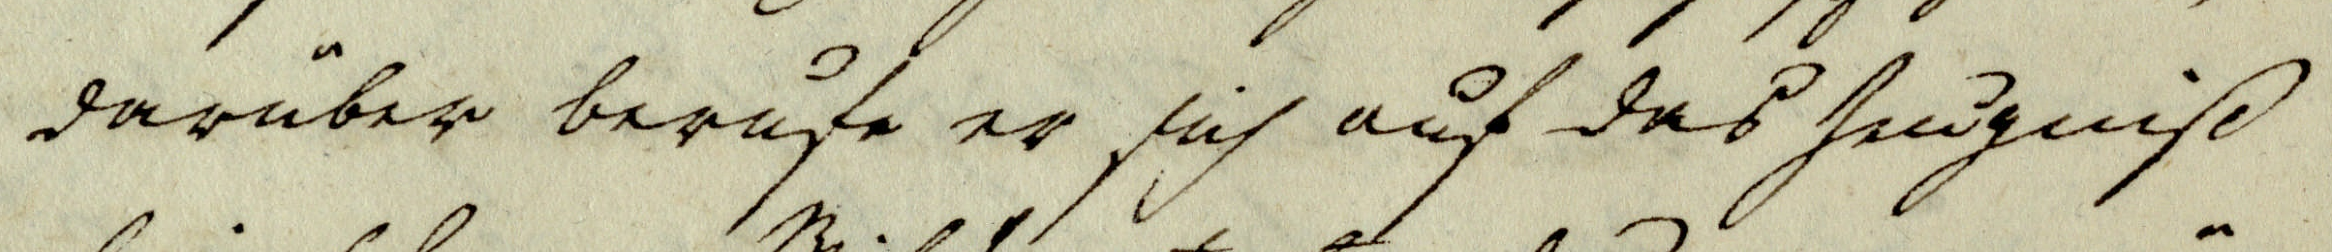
darüber berufe er sich auf das Zeugniß
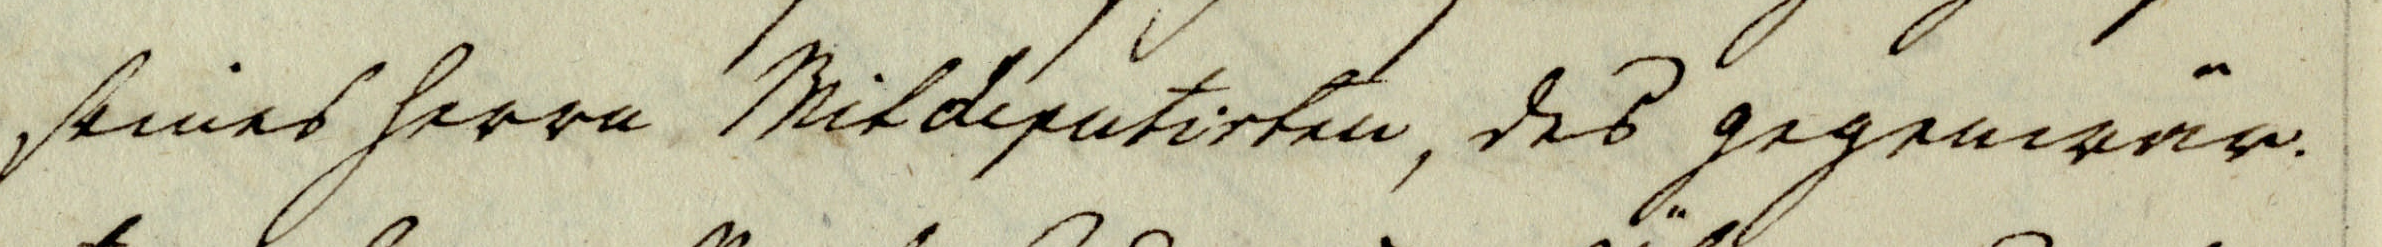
seines Herrn Mitdeputirten, des gegenwär¬
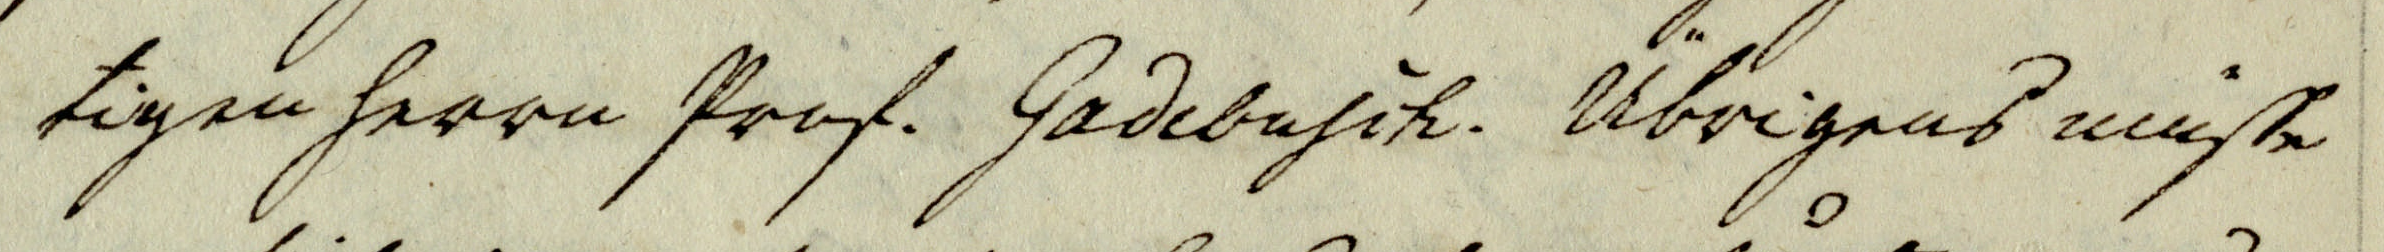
tigen Herrn Prof. Gadebusch. Übrigens müsse
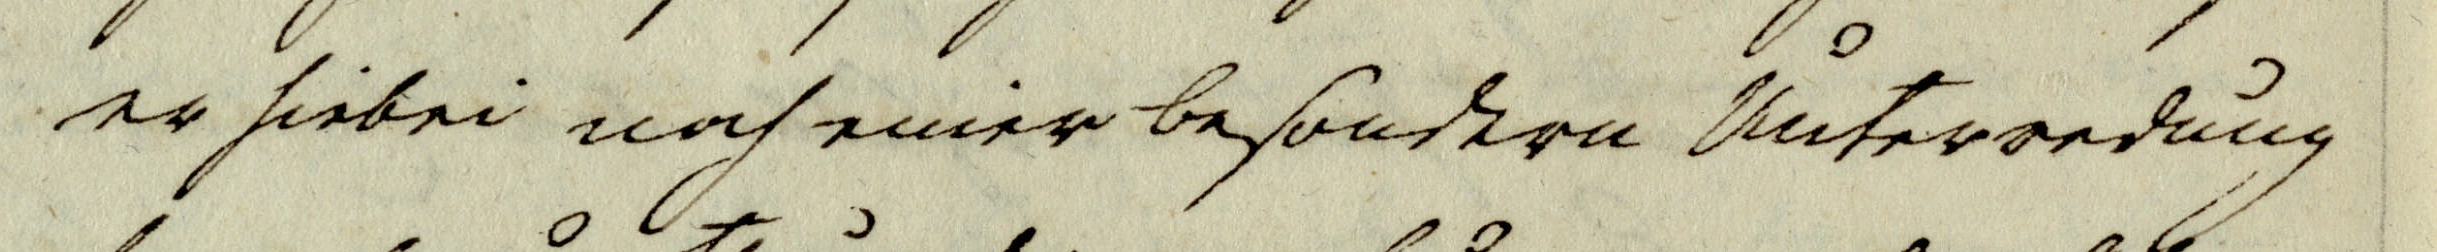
er hiebei noch einer besondern Unterredung
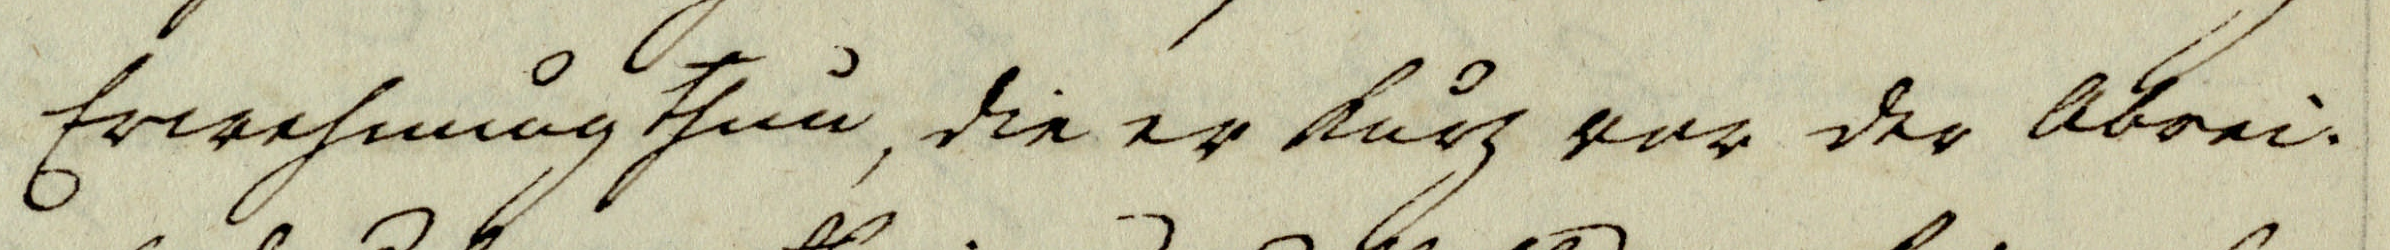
Erwehnung thun, die er kurz vor der Abrei¬
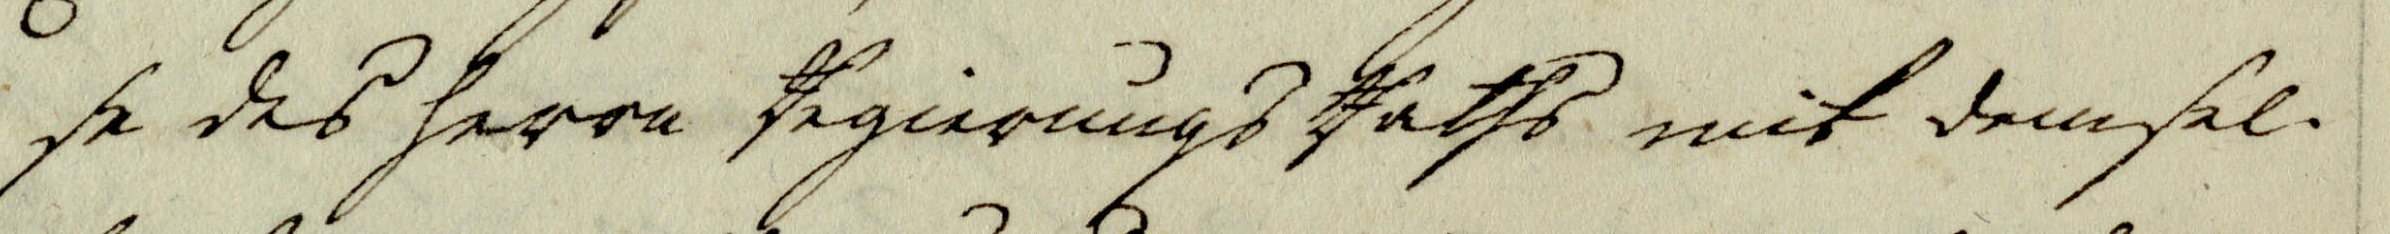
se des Herrn Regierungs Raths mit demsel¬
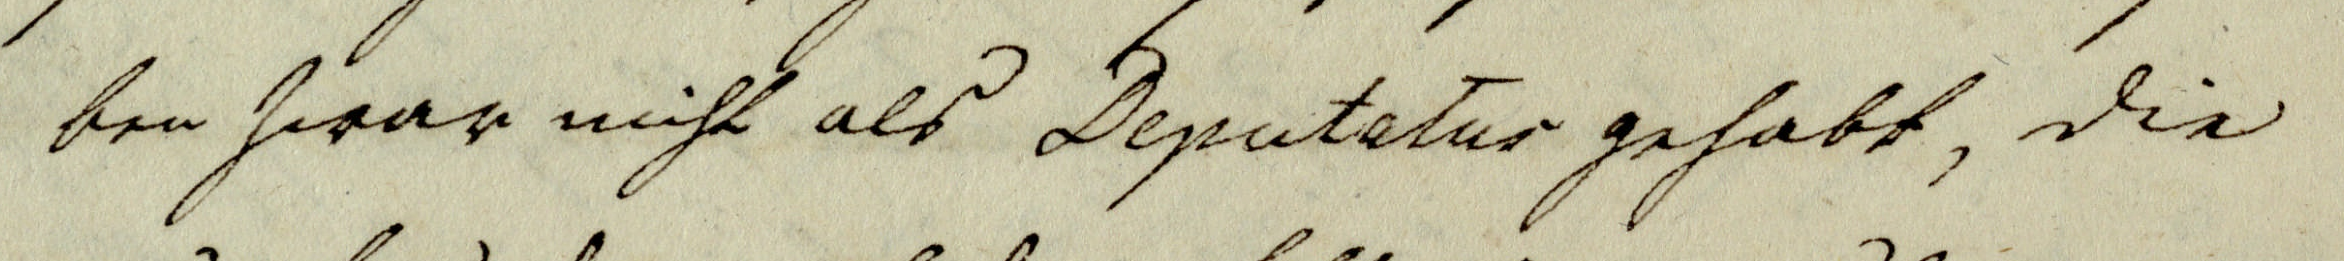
ben zwar nicht als Deputatus gehabt, die
